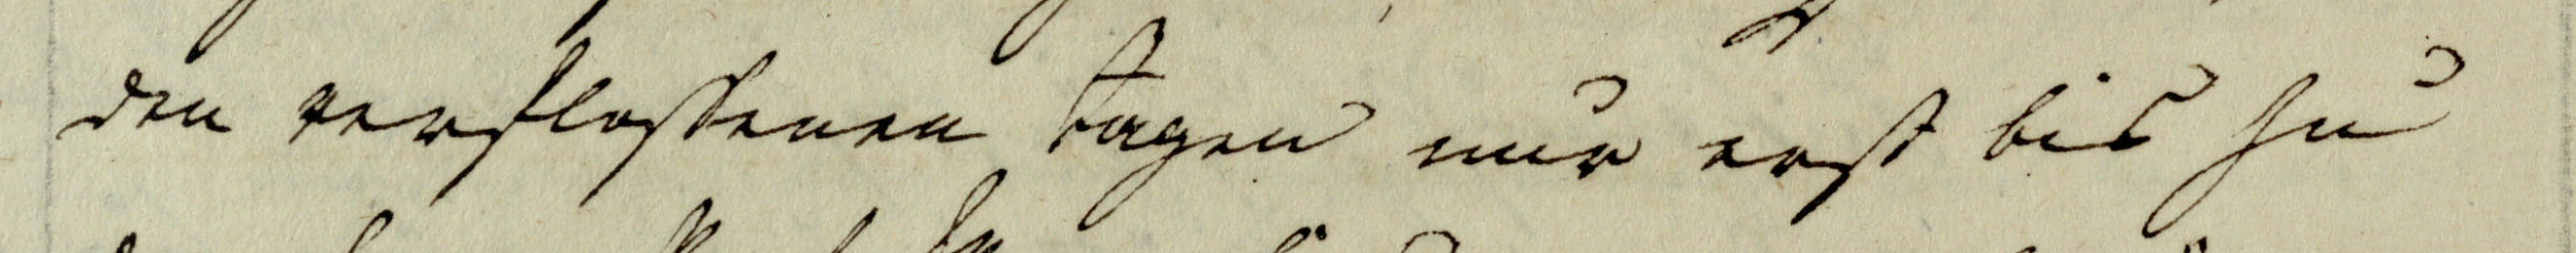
den verflossenen Tagen nur erst bis zu
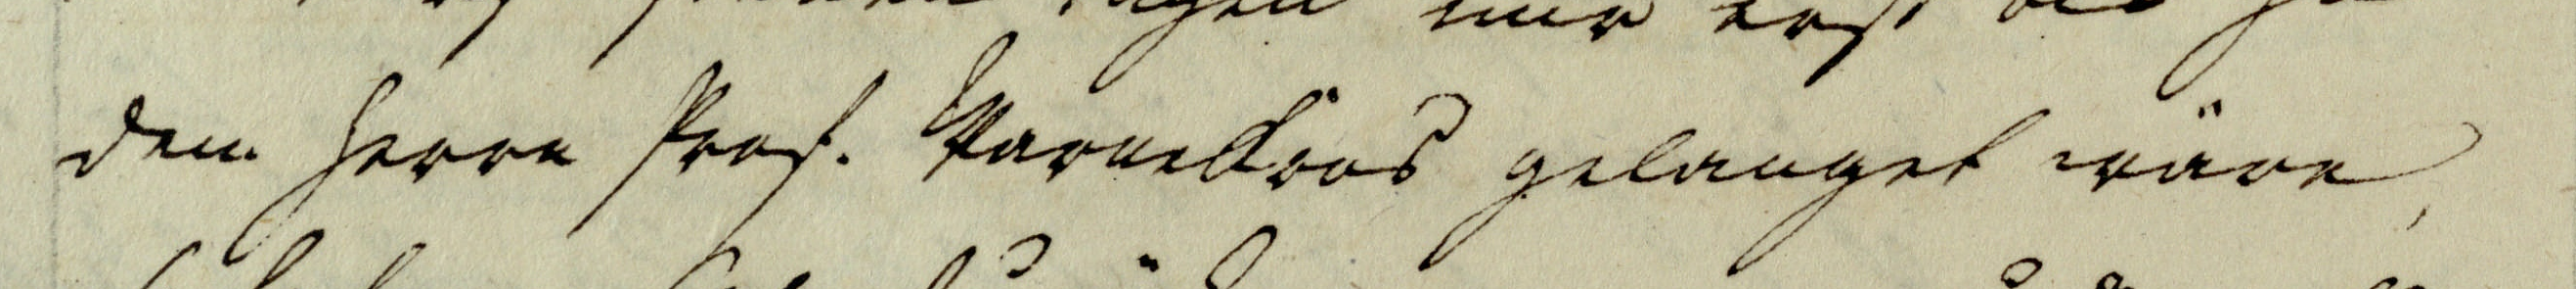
dem Herrn Prof. Warnekros gelanget wäre,
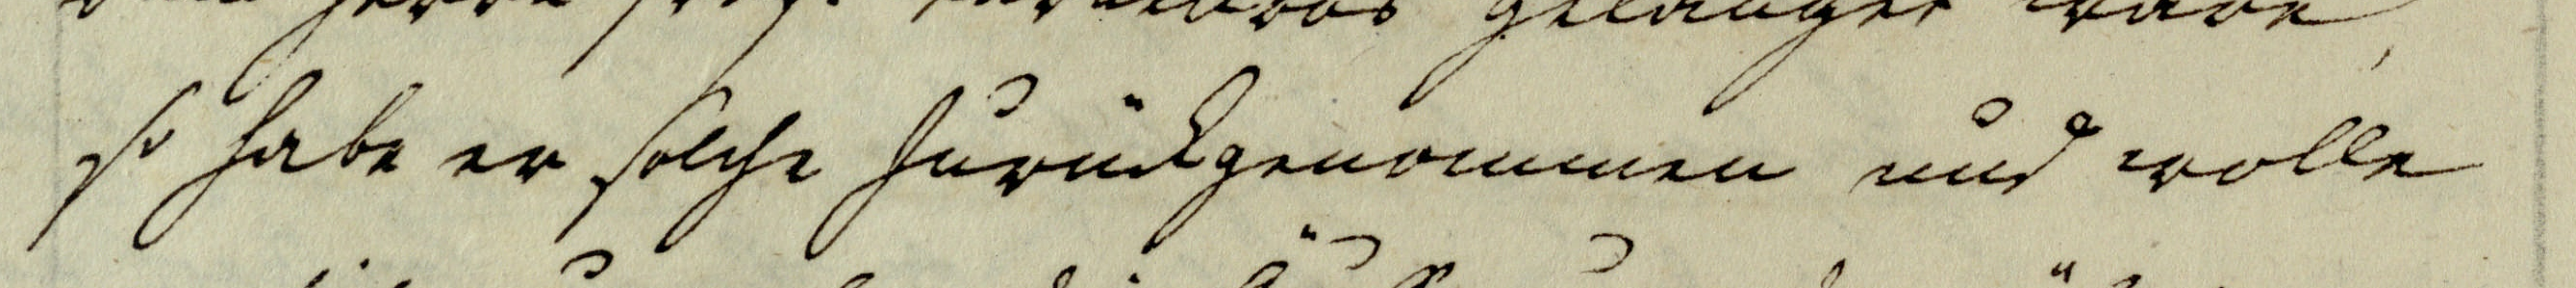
so habe er solche zurückgenommen und wolle
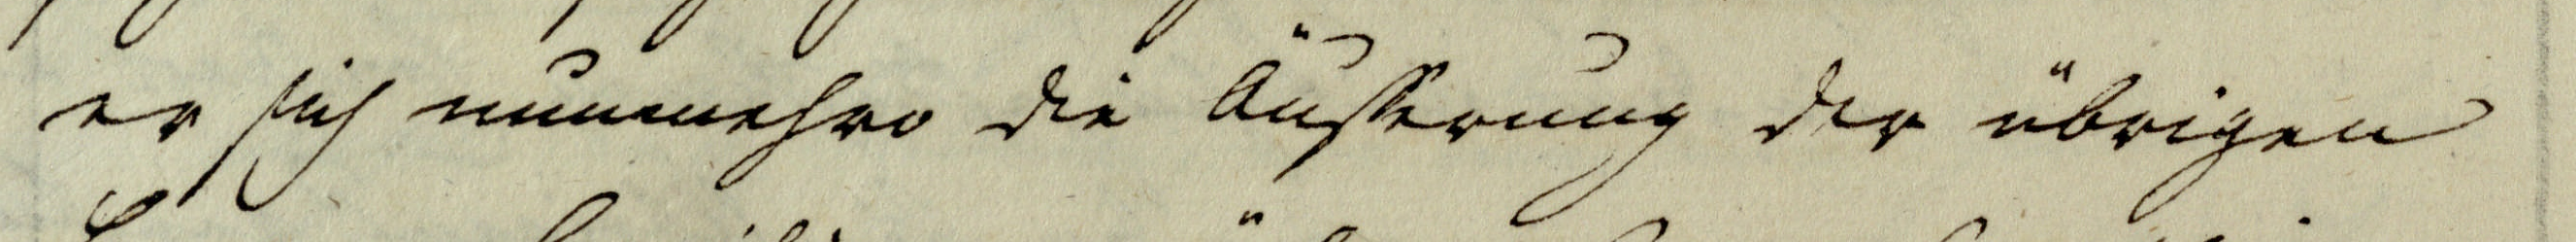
er sich nunmehro die Äusserung der übrigen
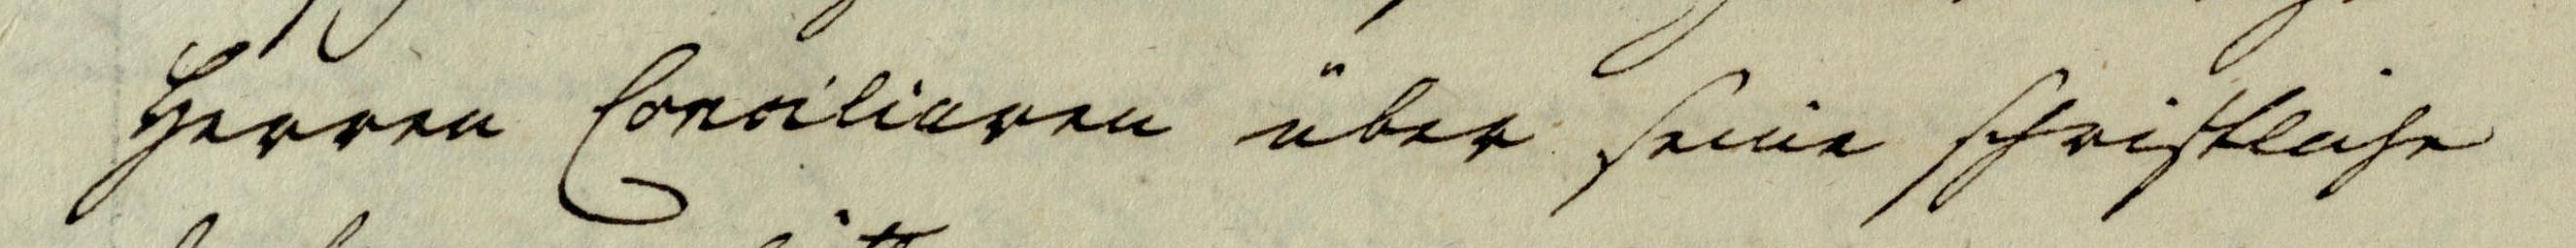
Herren Conciliaren über seine schriftliche
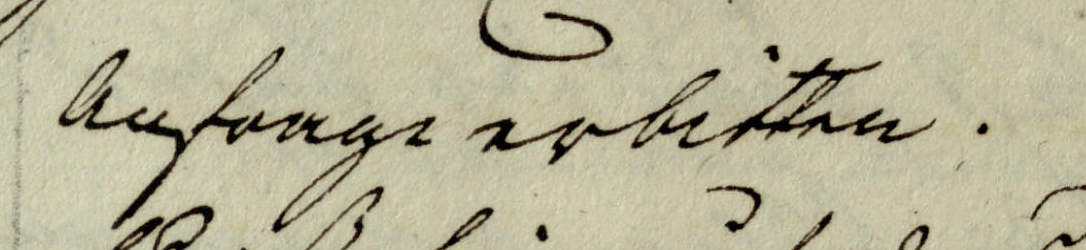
Anfrage erbitten.
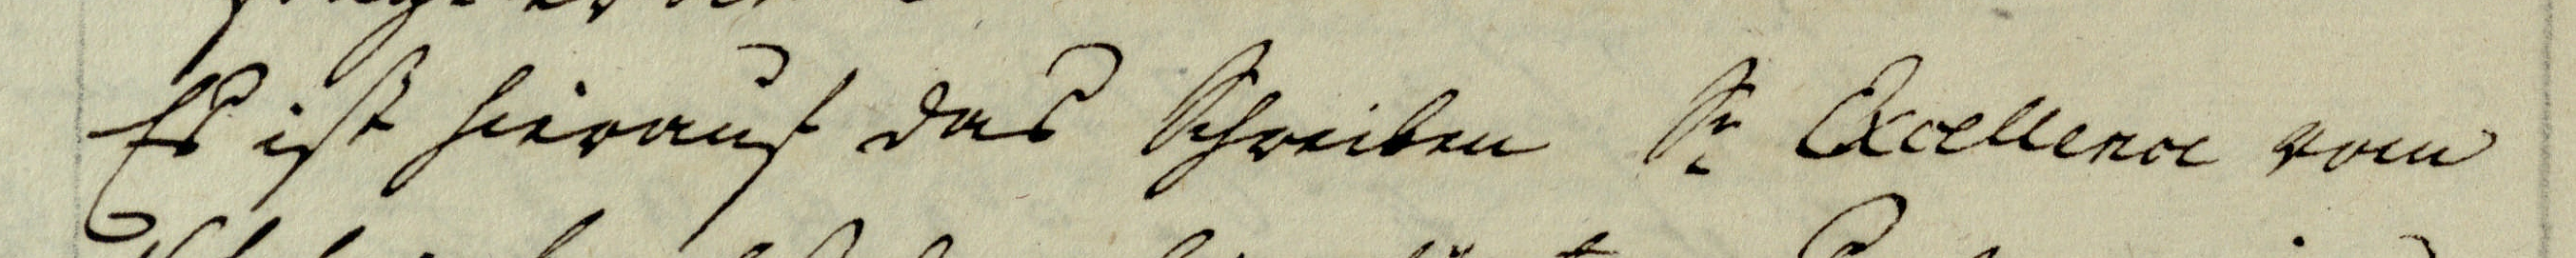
Es ist hierauf das Schreiben Sr Excellence vom
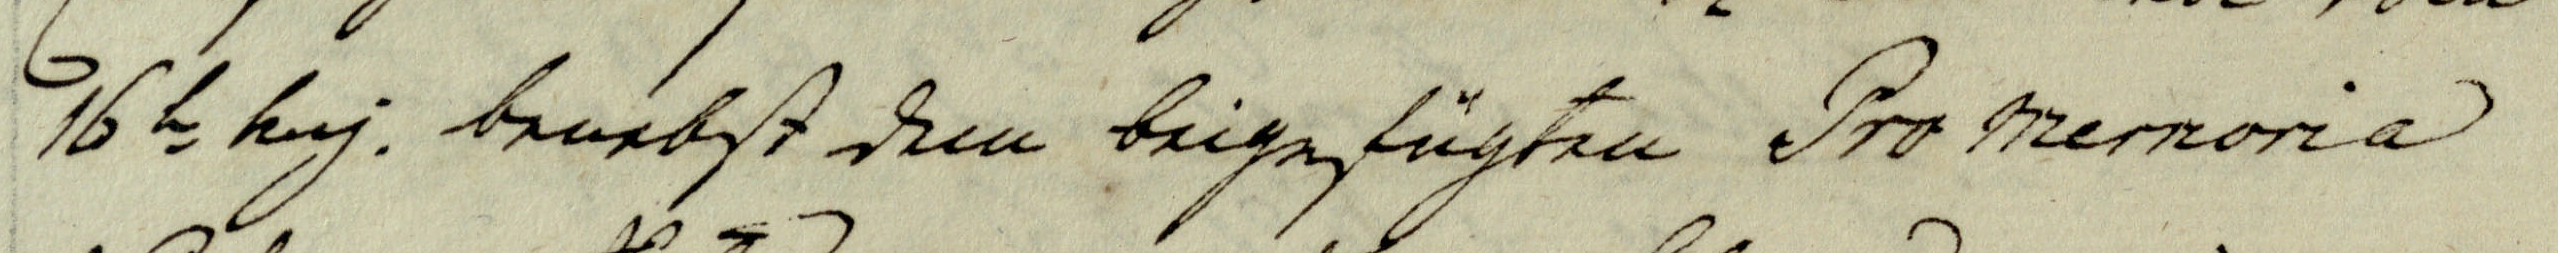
16 huj. benebst dem beigefügten Prof memoria
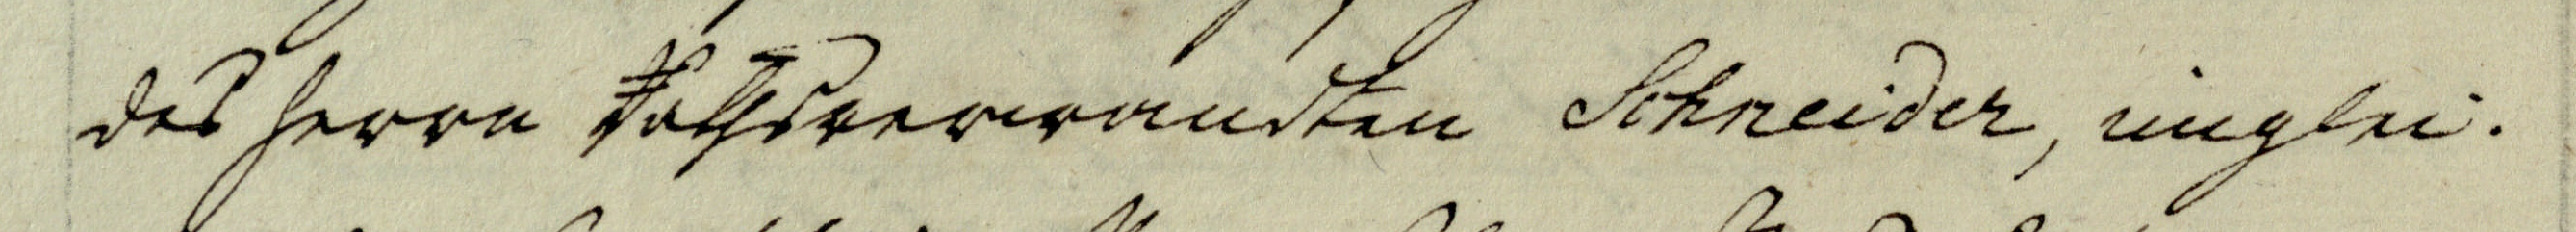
des Herrn Rathsverwandten Schneider, imglei¬
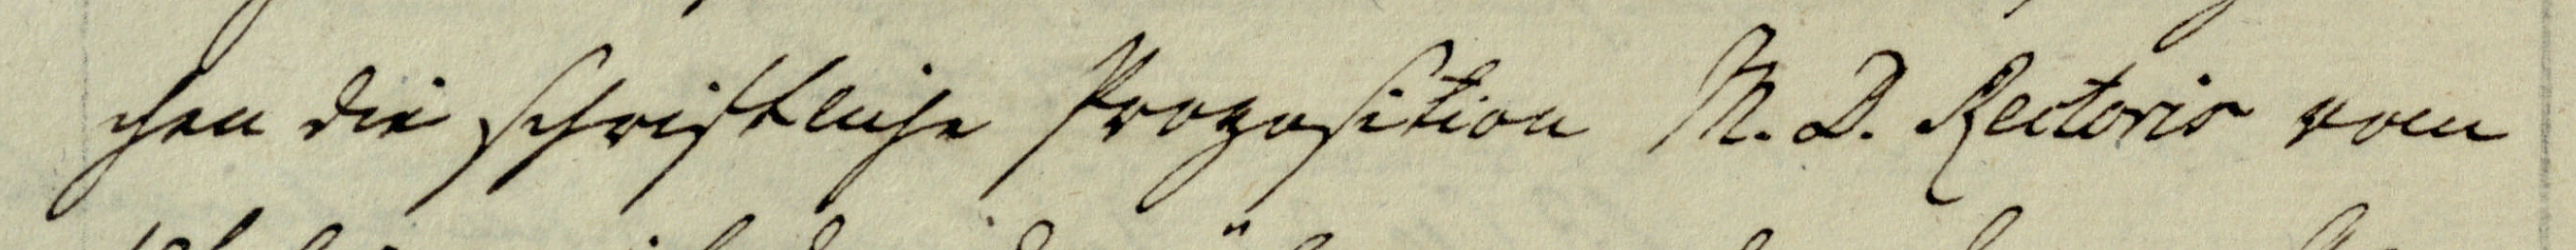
chen die schriftliche Proposition M. D. Rectoris vom
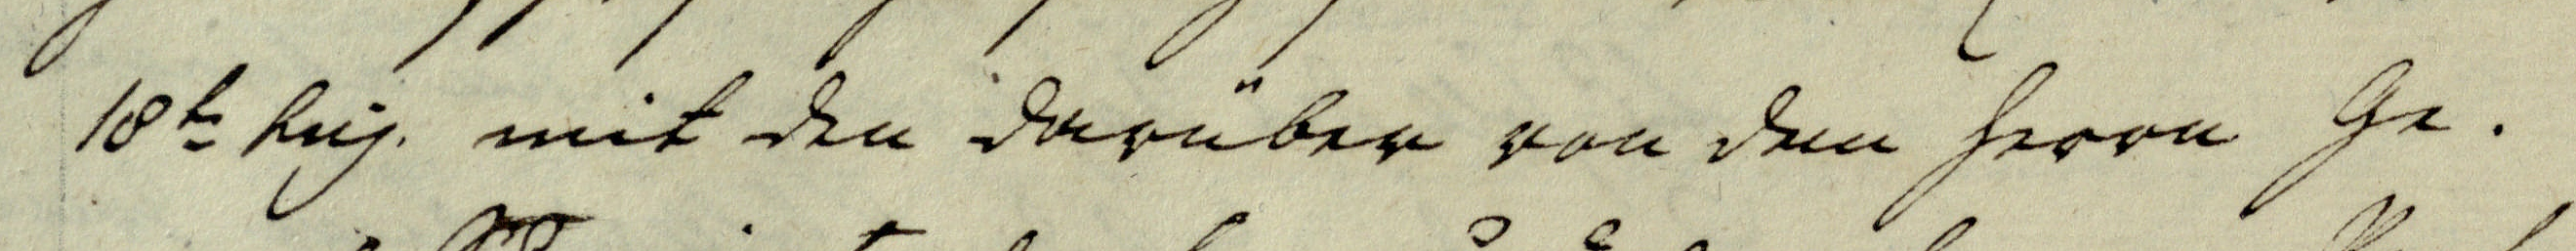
18 t huj. mit den darüber von dem Herrn Ge¬
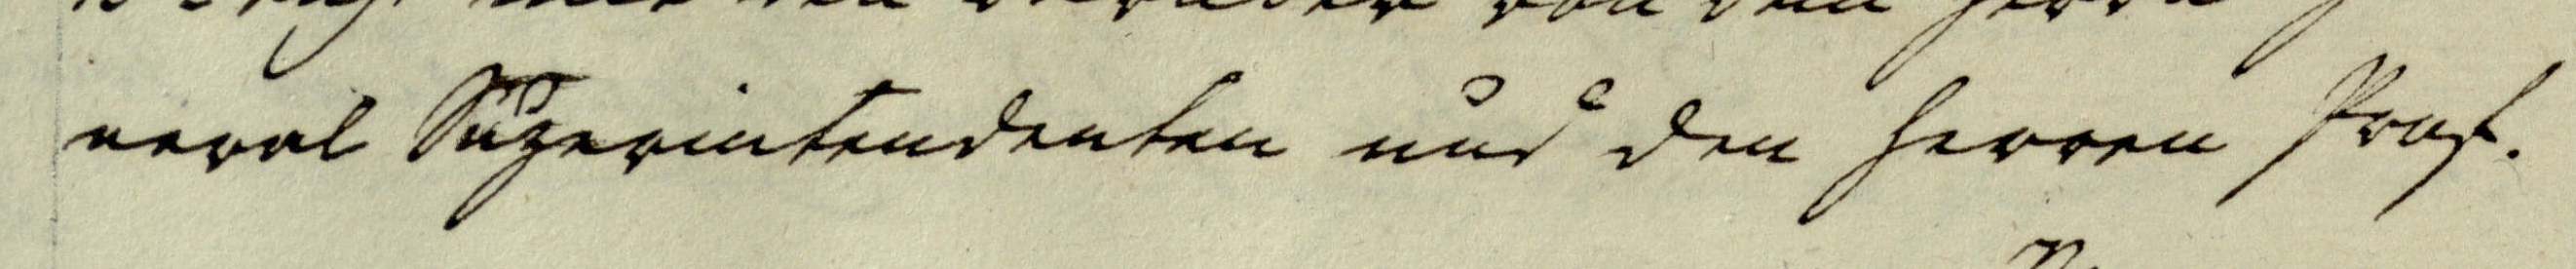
neral Superintendenten und den Herren Prof.
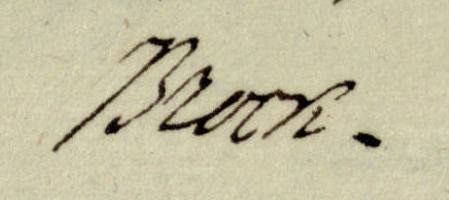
Brock¬
